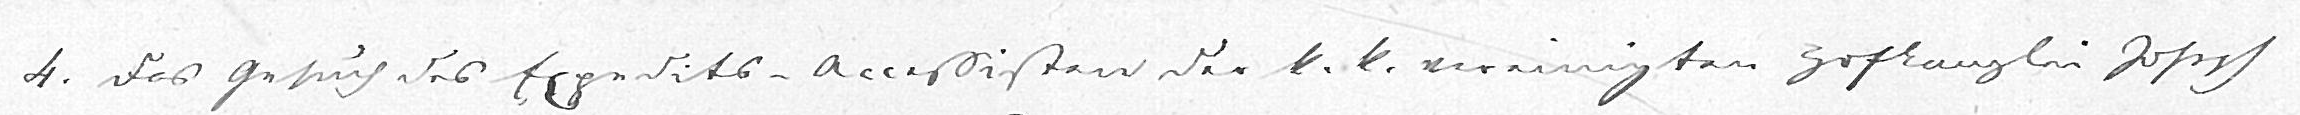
4. Das Gesuch des Expedits-Accessisten der k.k. vereinigten Hofkanzlei Joseph
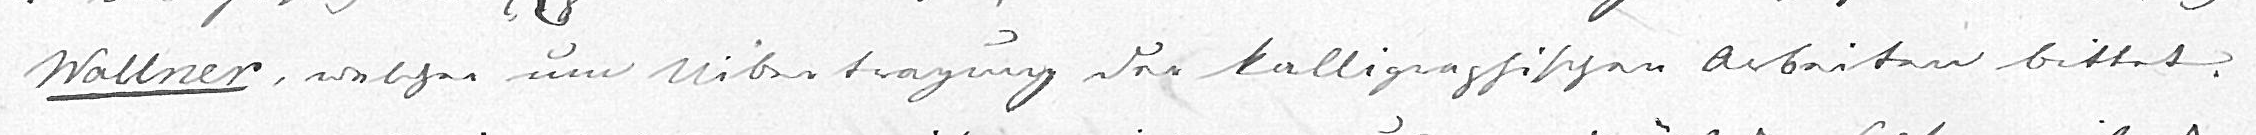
Wallner, welcher um Uebertragung der kalligraphischen Arbeiten bittet.
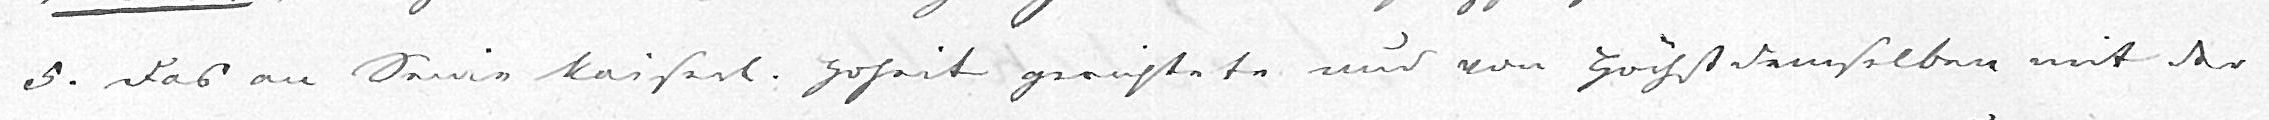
5. Das an Seine kaiserl. Hoheit gerichtete und von Höchstdemselben mit der
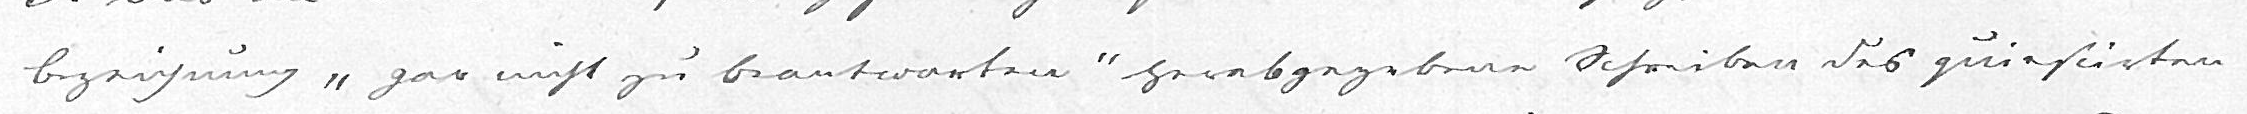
Bezeichnung "gar nicht zu beantworten" herabgegebene Schreiben des quiescirten
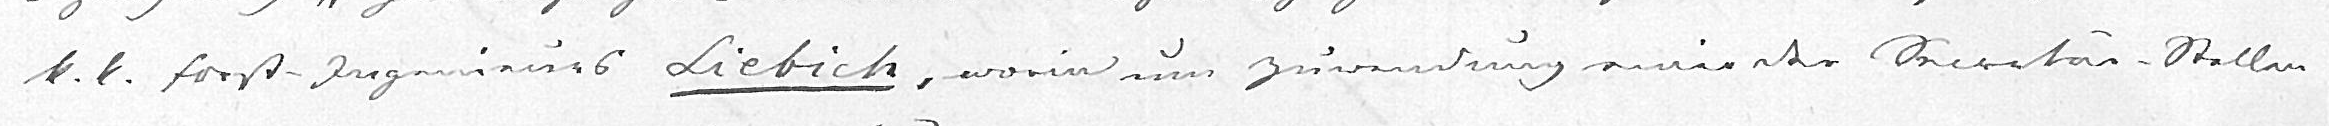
k.k. Forst-Ingenieurs Liebich, worin um Zuwendung einer der Secretär-Stellen
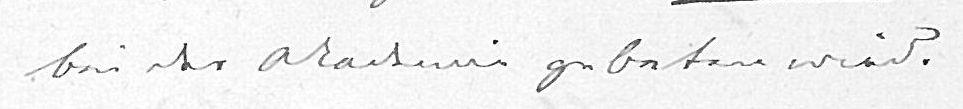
bei der Akademie gebeten wurde.
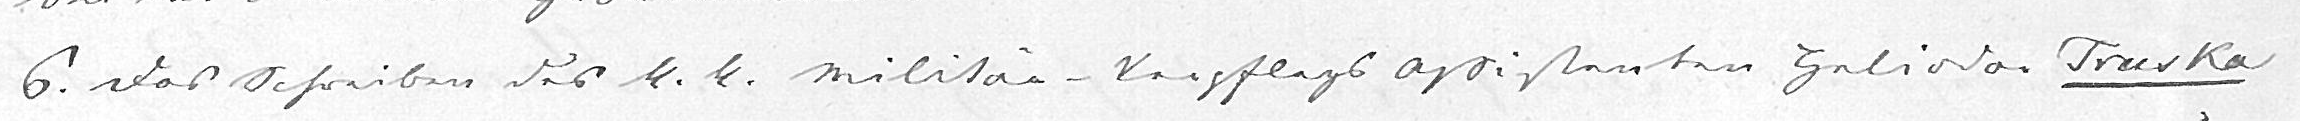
6. Das Schreiben des k.k. Militär-Verpfegs Assistenten Heliodor Truska
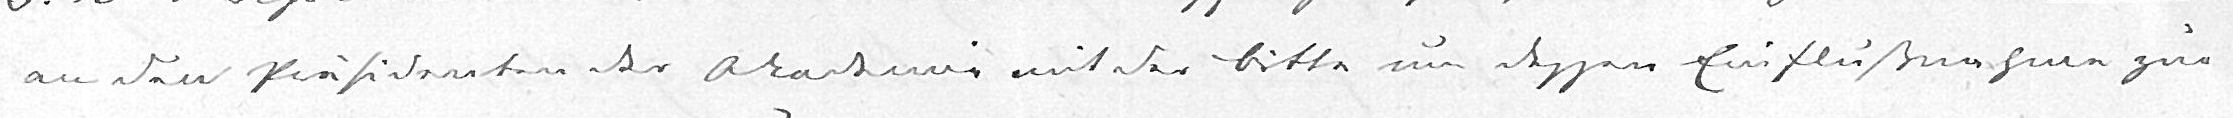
an den Präsidenten der Akademie mit der Bitte um dessen Einflußungen zur
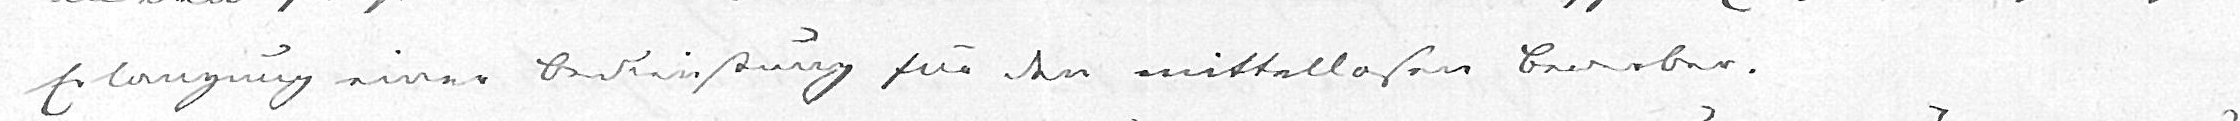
Erlangung einer Bedienstung für den mittellosen Bewerber.
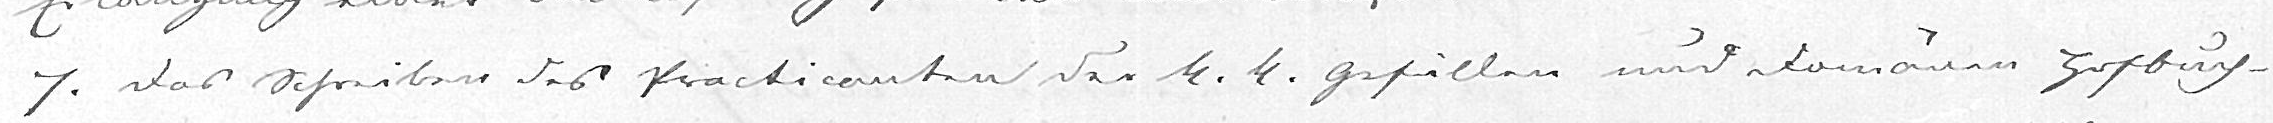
7. Das Schreiben des Practicanten der k.k. Gefällen und Domänen Hofbuch-
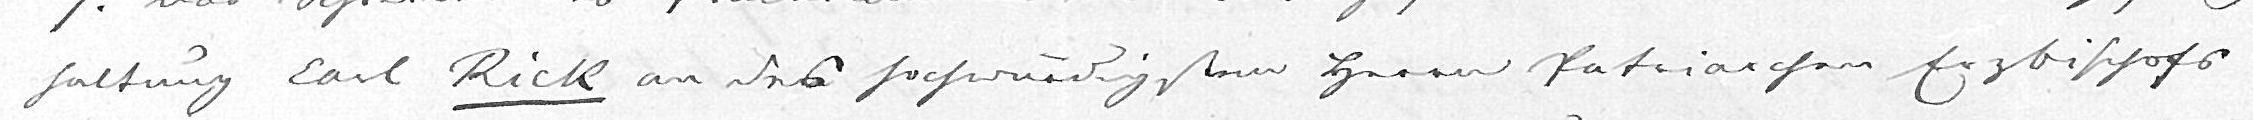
haltung Carl Rick an des hochwürdigsten Herrn Patriarchen Erzbischofs
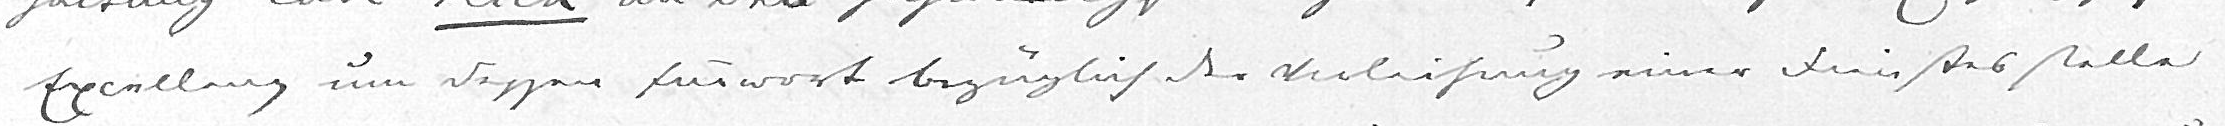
Excellenz um dessen Fürwort bezüglich der Verleihung einer Dienstesstelle
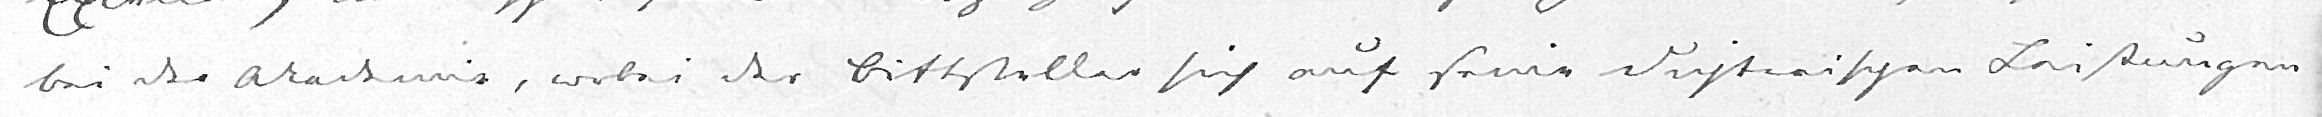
bei der Akademie, wobei der Bittsteller sich auf seine dichterischen Leistungen
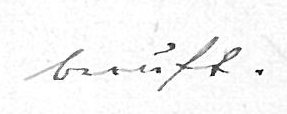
beruft.
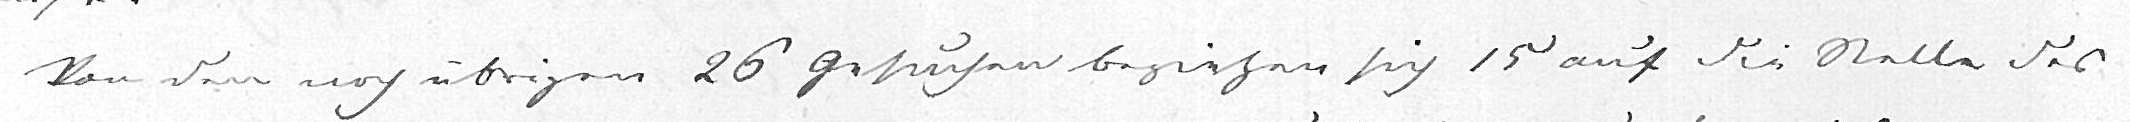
Von den noch übrigen 26 Gesuchen beziehen sich 15 auf die Stelle des
